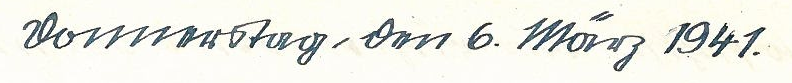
Donnerstag, den 6. März 1941.
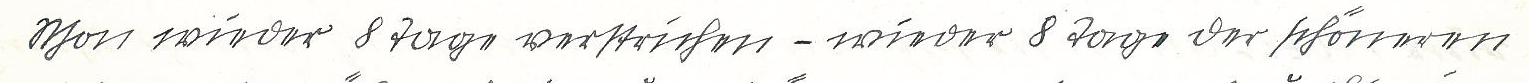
Schon wieder 8 Tage verstrichen – wieder 8 Tage der schönen
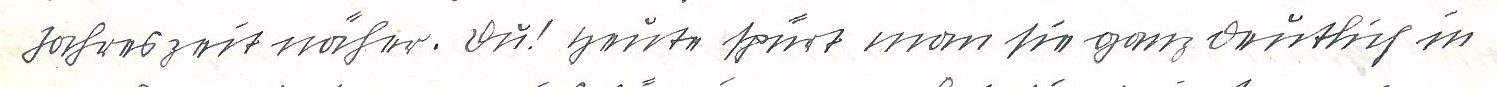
Jahreszeit näher. Du! Heute spürt man sie ganz deutlich in
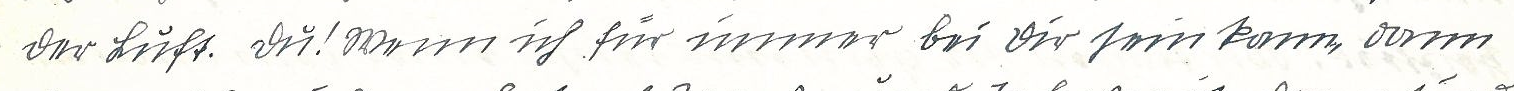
der Luft. Du! Wenn ich für immer bei Dir sein kann, dann
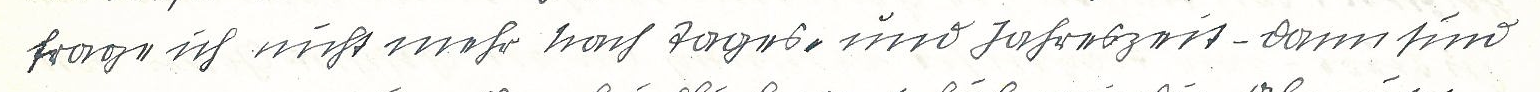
frage ich nicht mehr nach Tages- und Jahreszeit – dann sind
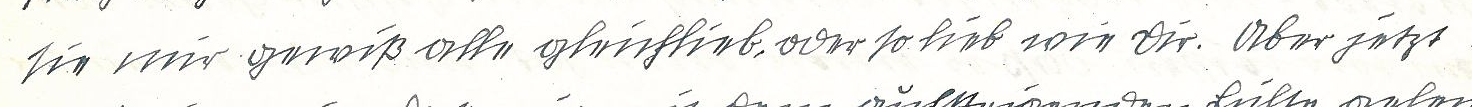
sie mir gewiß alle gleich lieb, oder so lieb wie Dir. Aber jetzt
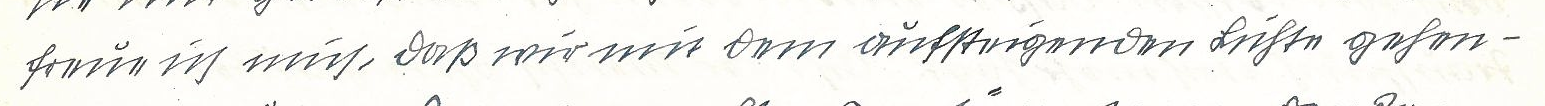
freue ich mich, daß wir mit dem aufsteigenden Lichte gehen –
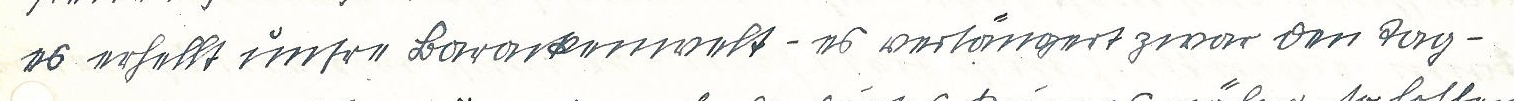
es erhellt unsre Barackenwelt – es verlängert zwar den Tag –
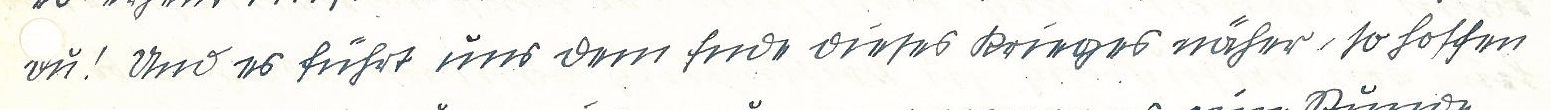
Du! Und es führt uns dem Ende dieses Krieges näher, so hoffen
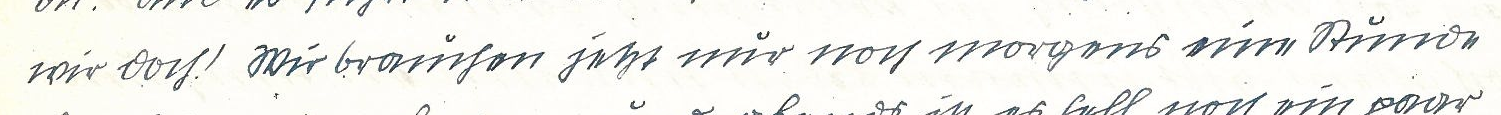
wir doch! Wir brauchen jetzt nur noch morgens eine Stunde
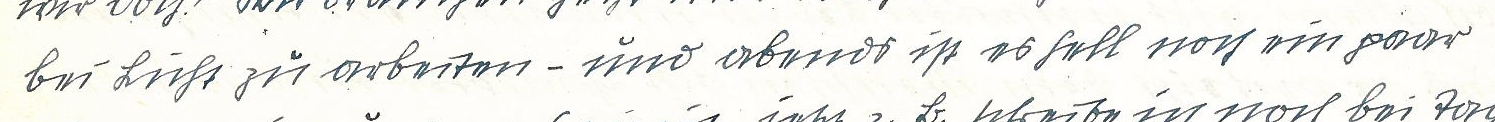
bei Licht zu arbeiten – und abends ist es hell noch ein paar
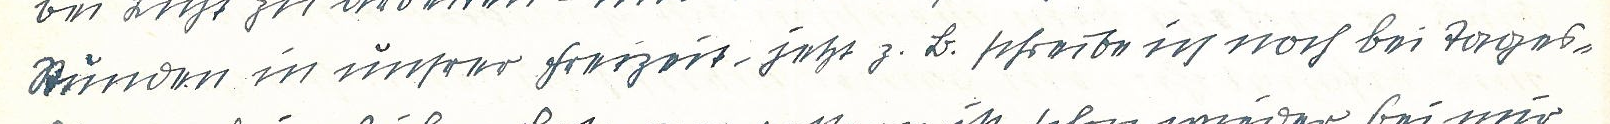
Stunden in unsrer Freizeit, jetzt z B schreibe ich noch bei Tages¬
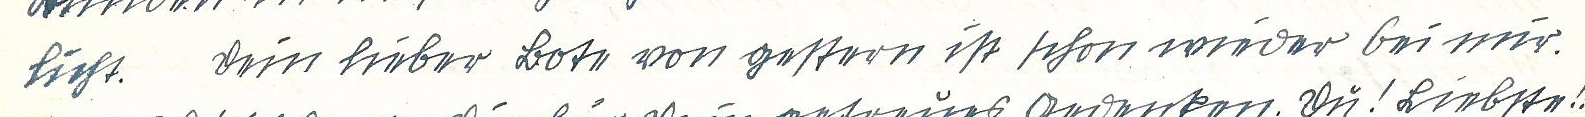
licht. Dein lieber Bote von gestern ist schon wieder bei mir.
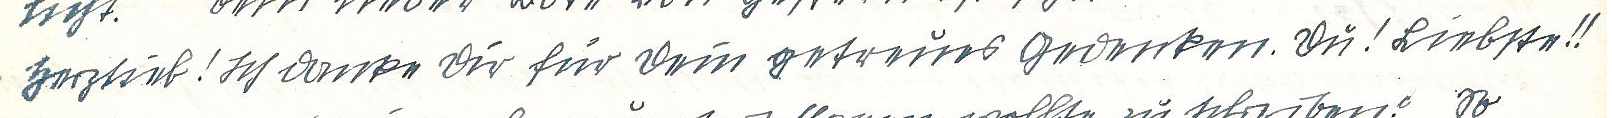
Herzlieb! Ich danke Dir für Dein getreues Gedenken. Du! Liebste!!
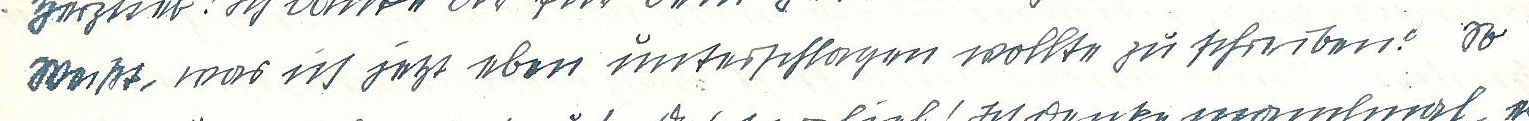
Weißt, was ich jetzt eben unterschlagen wollte zu schreiben? So
